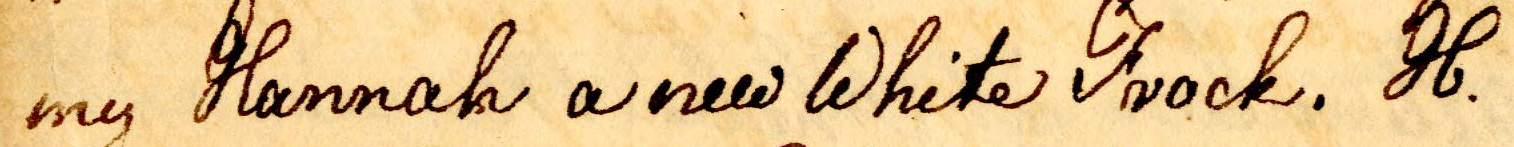my Hannah a new White Frock. H.
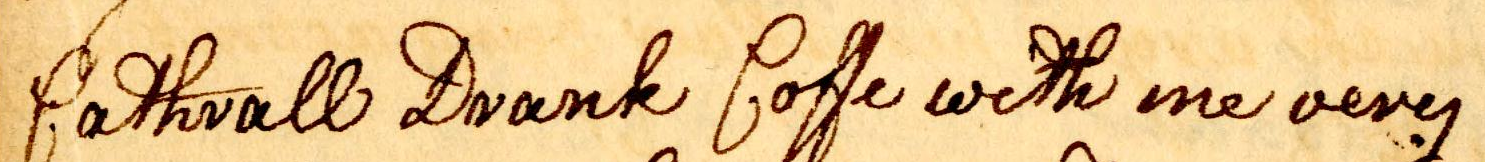Cathrall Drank Coffe with me very
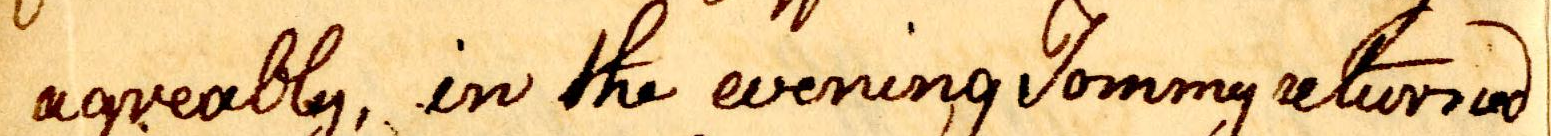agreably in the evening Tommy returned
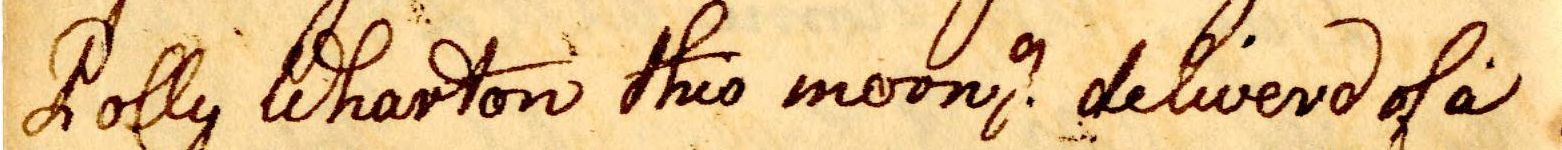Polly Wharton this morn^g. deliverd of a
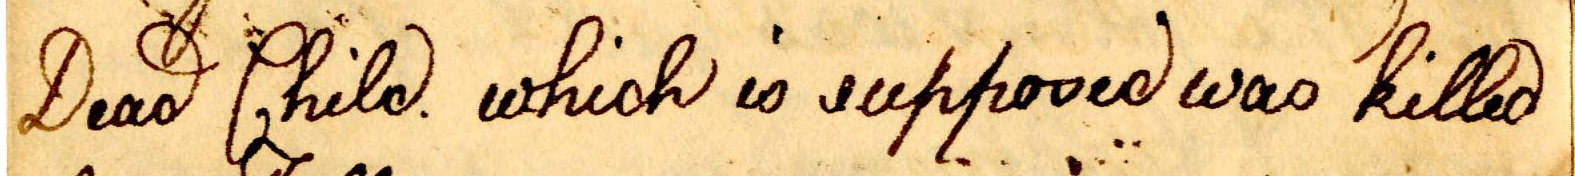Dead Child. which is supposed was killed
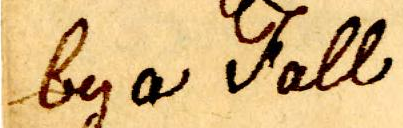by a Fall
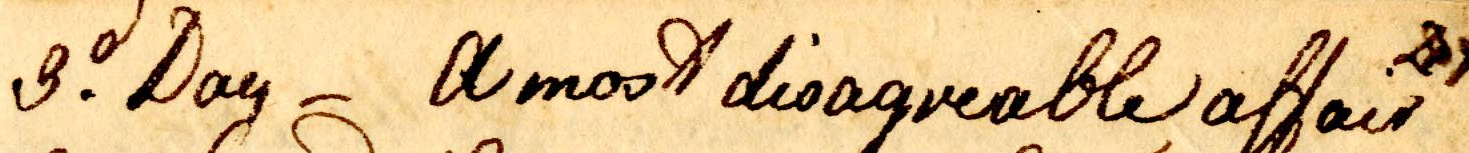3^d Day- A most disagreable affair
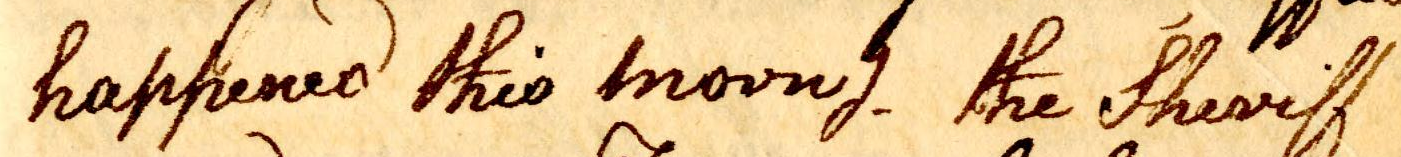happened this morn^g- the Sheriff
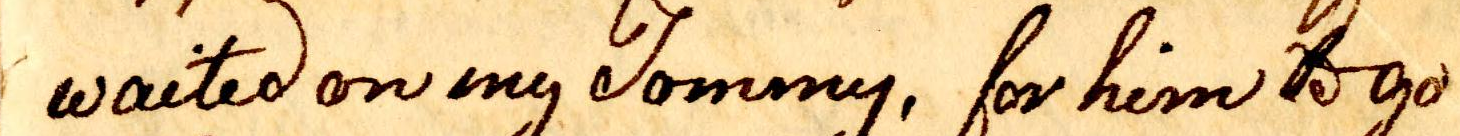waited on my Tommy, for him to go
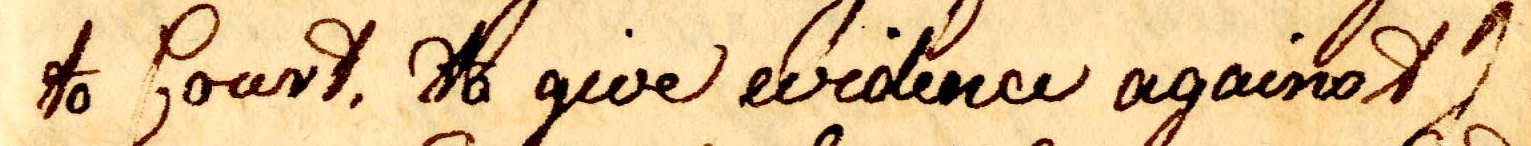to Court to give evidence against J
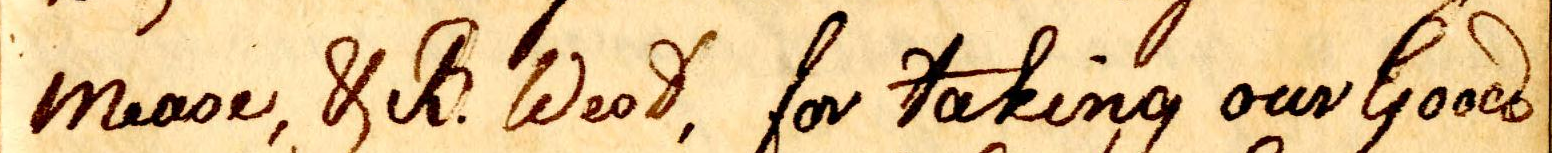Mease, & B. West, for taking our Goods
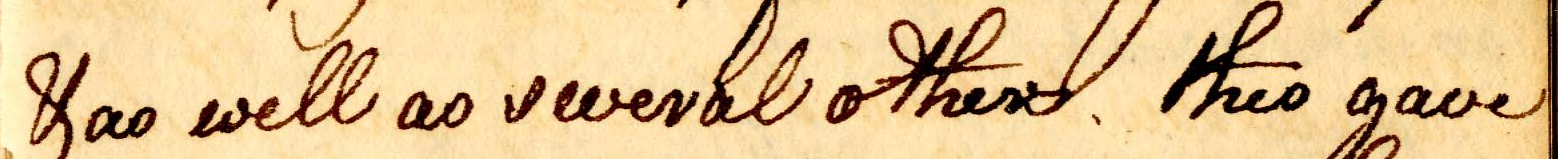& as well as several others this gave
